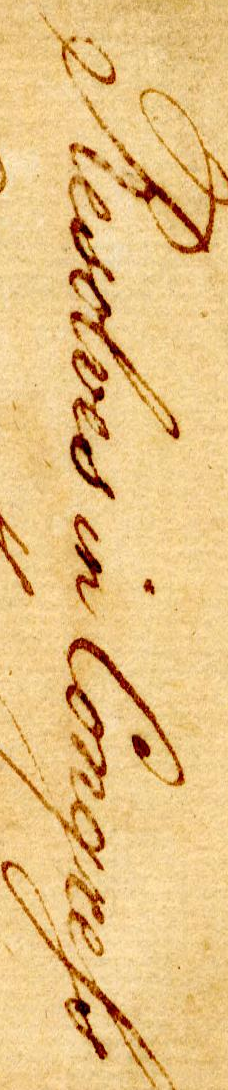Resolves in Congress
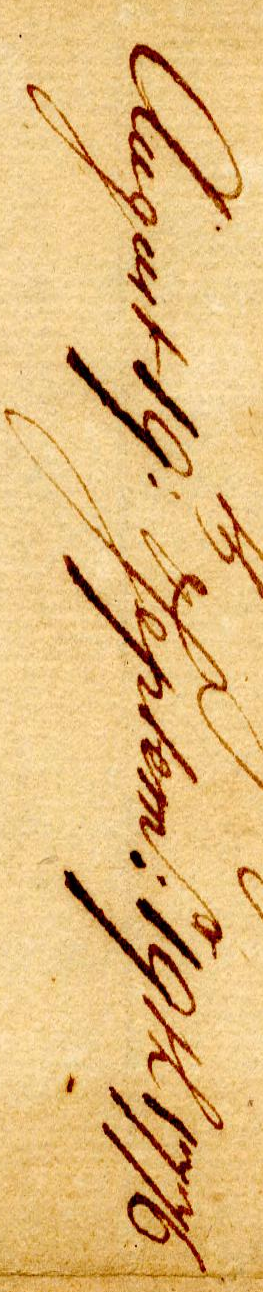August 19^th. Septem^r: 19th 1776
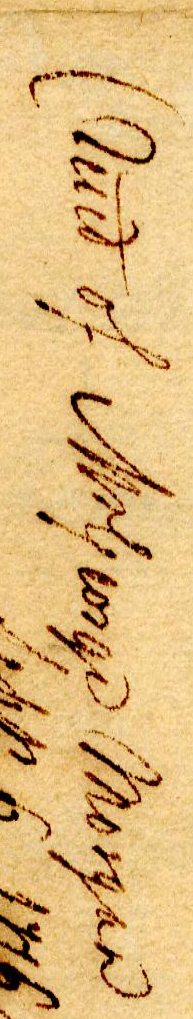(Reced of M^r George Morgan
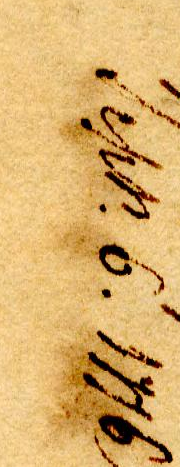Sepr. 6. 1776)
